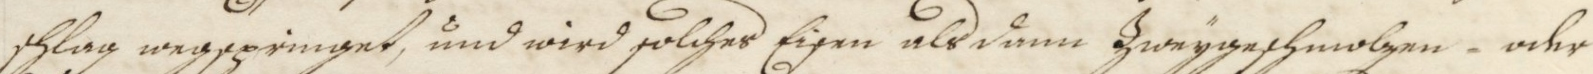schlag wegspringet, und wird solches Eisen als dann Zweygeschmolzen - oder
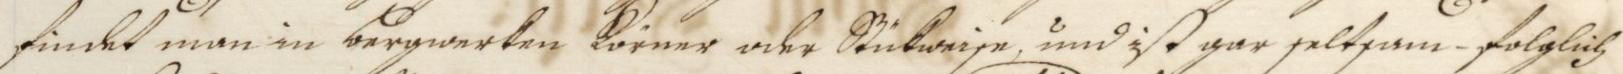findet man in Bergwerken Körner oder Stükweise, und ist gar seltsam — folglich
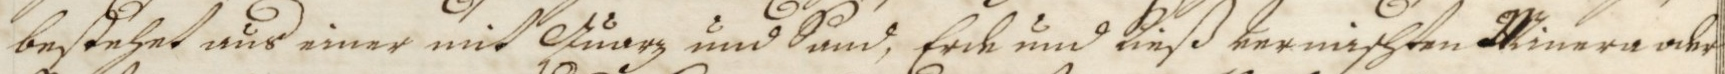bestehet aus einer mit Quarz und Sand, Erde und Kieß vermischten Minera oder
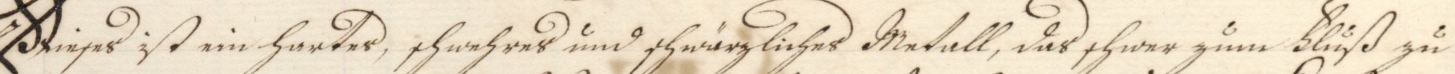Dieses ist ein hartes, schwehres und schwärzliches Metall, das schwer zum Fluß zu
